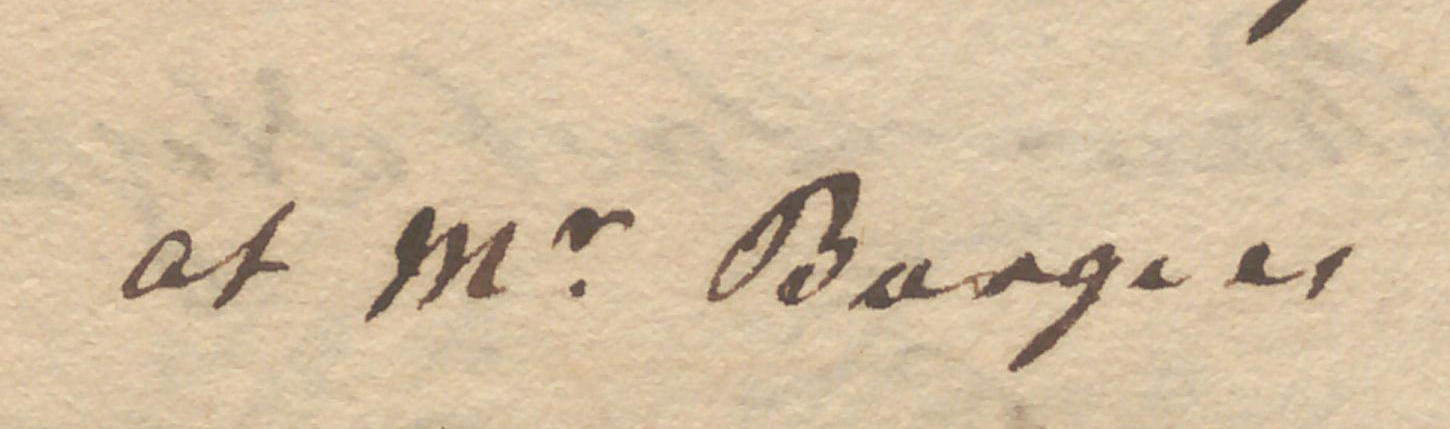at M^r. Barges
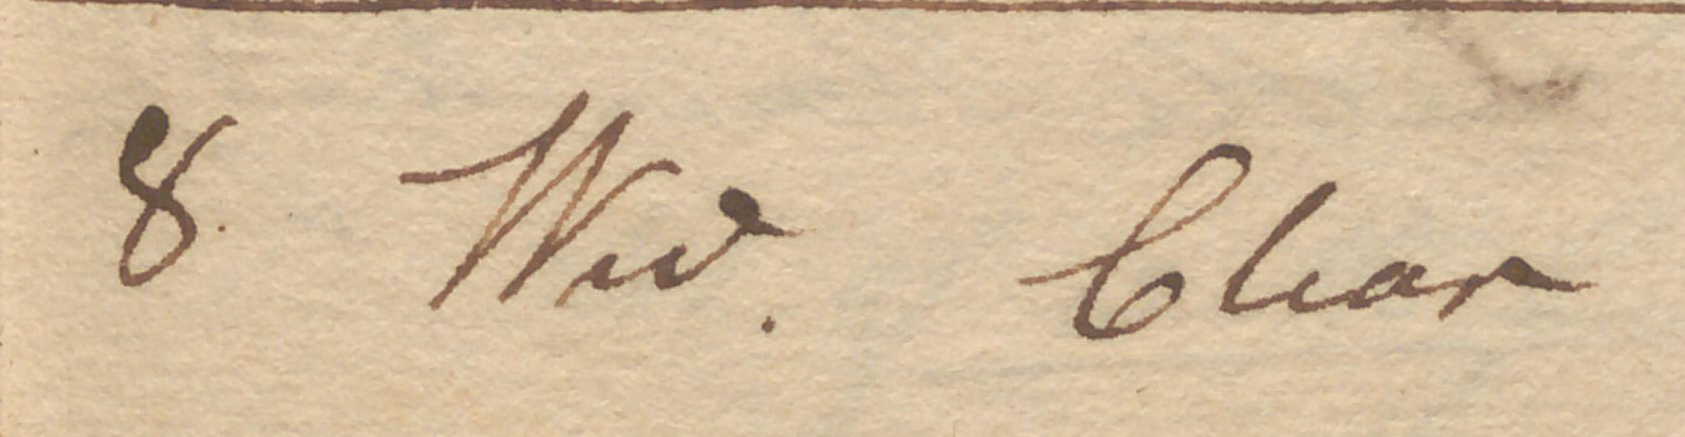8. We Clear
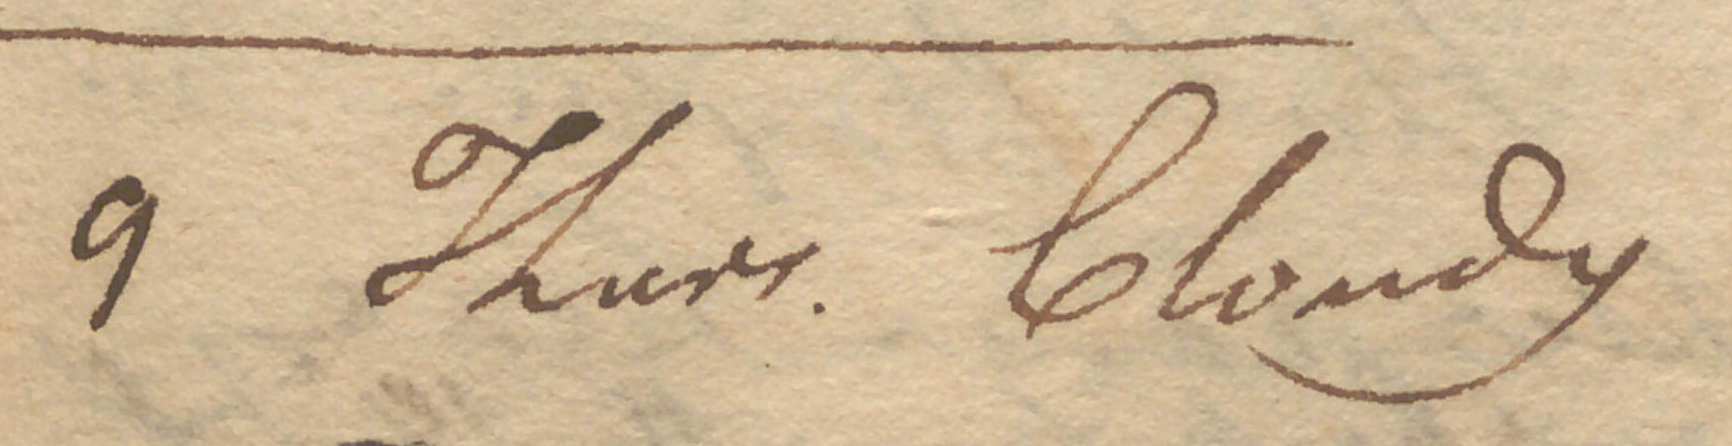9 Thurs. Cloudy
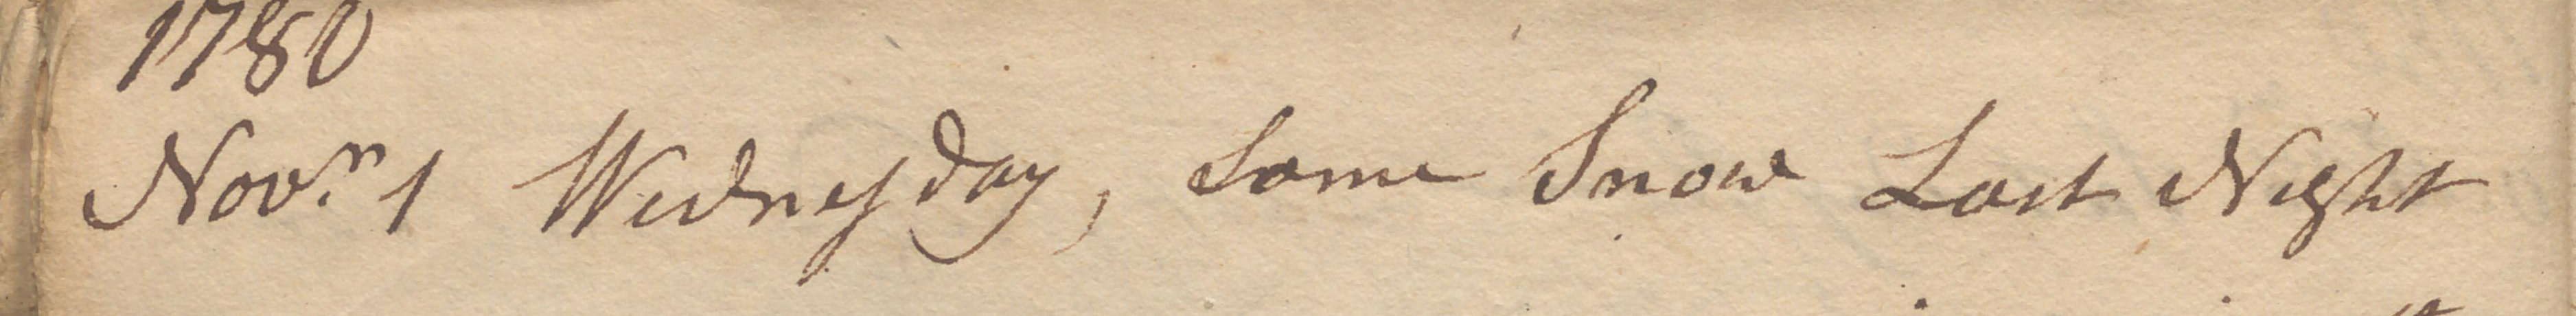Nov^r. 1 Wednesday, some Snow Last Night
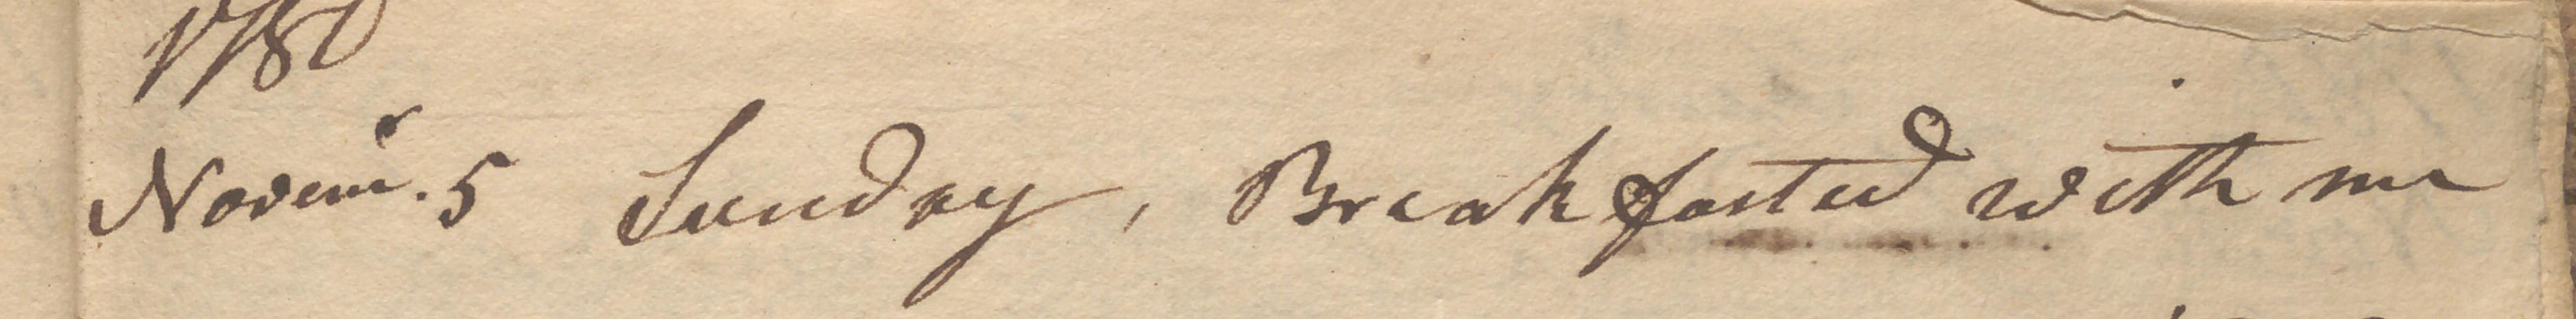Novem^r. 5 Sunday, Breakfasted with me
